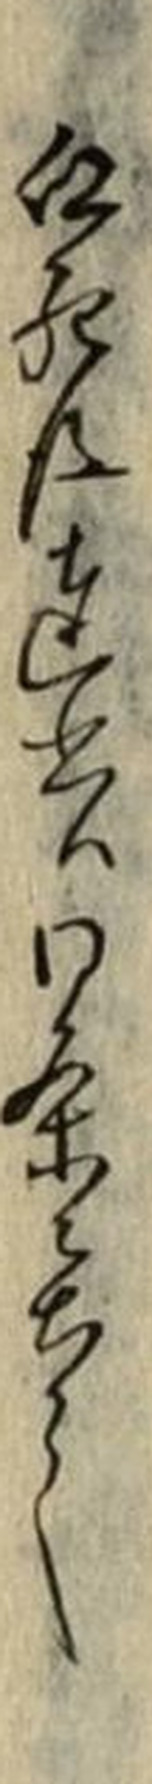但死後達書ハ同条ニ出之
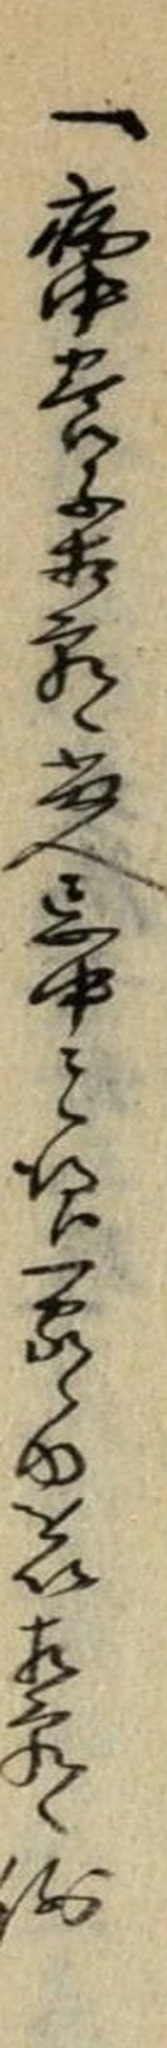一病中養子相願候当人忌中ニ候得ハ一家之内を以相願候例
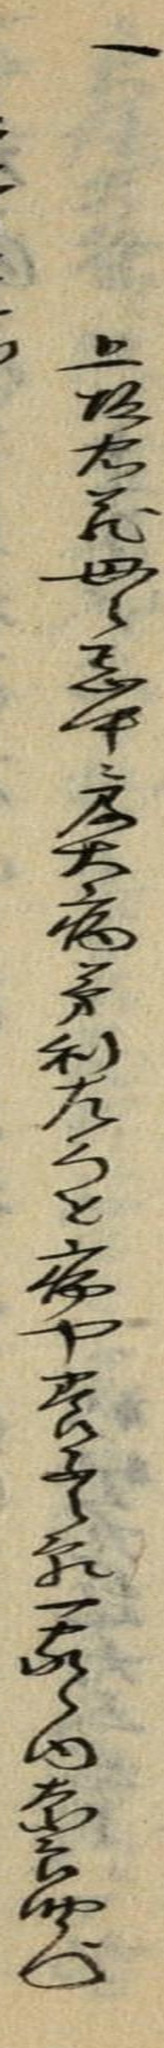一上坂忠蔵母之忌中ニ及大病弟利左衛門を病中養子之願一家之内奈良助右衛門
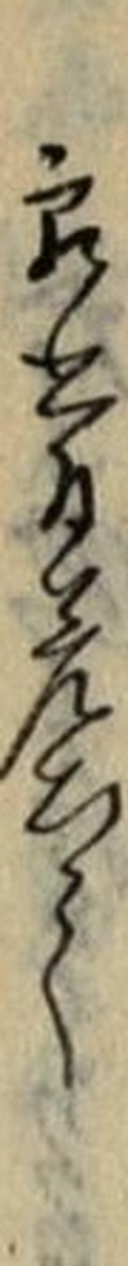願書付差出之
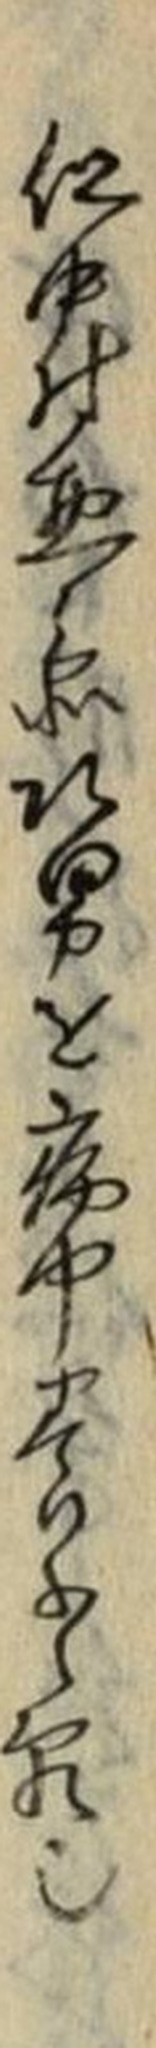但中村惣兵衛次男を病中養子之願也
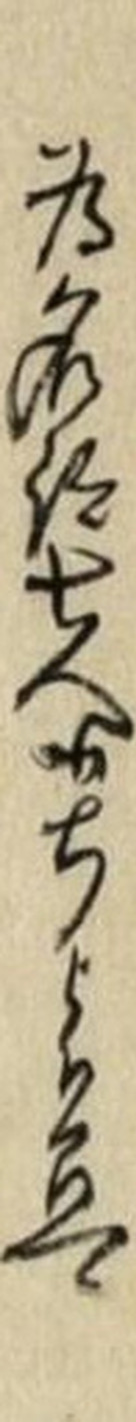為名跡七人ふち被下置候
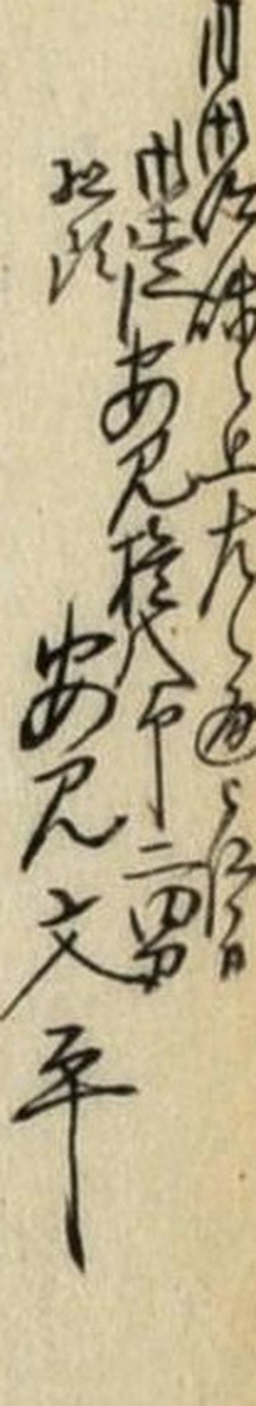安見文平
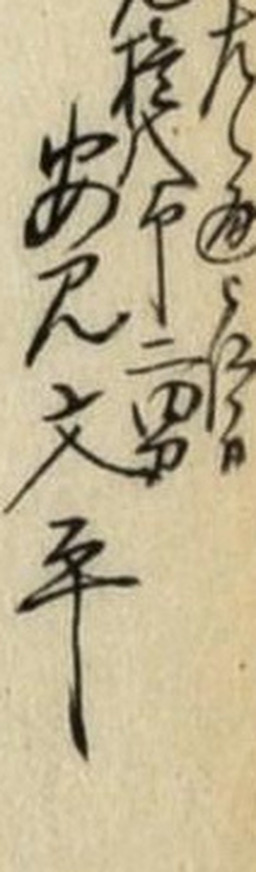安見文平
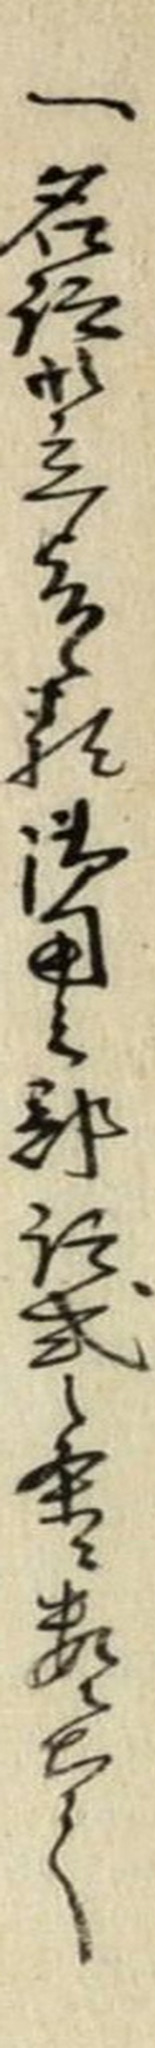一名跡御立被下候類御用之部跡式之条ニ数々出之
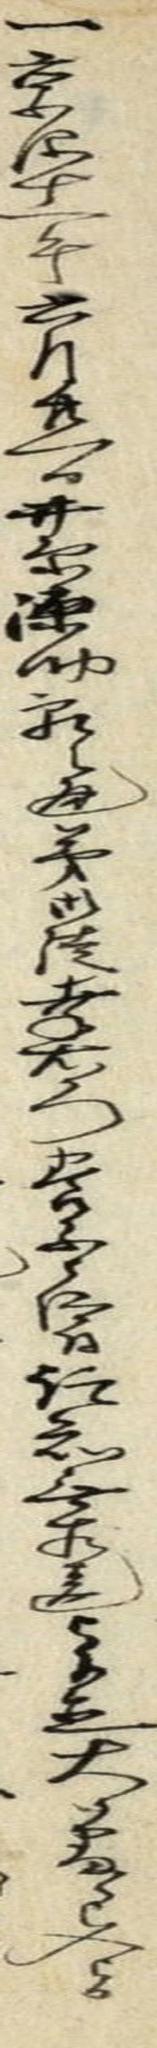一享保十一年六月廿一日井原源助願之通弟御徒幸右衛門養子被仰付跡知無相違被下置大御番へ被入旨
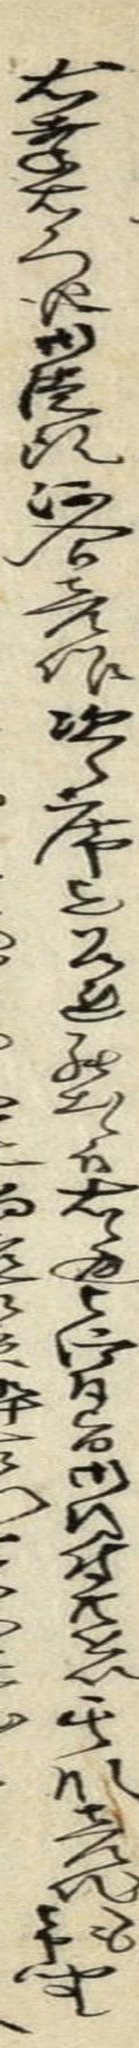右幸右衛門儀御徒頭河合彦次之席迄召連罷出候ニ付右之通被仰付旨御目付共を以其段彦作へも被申聞候
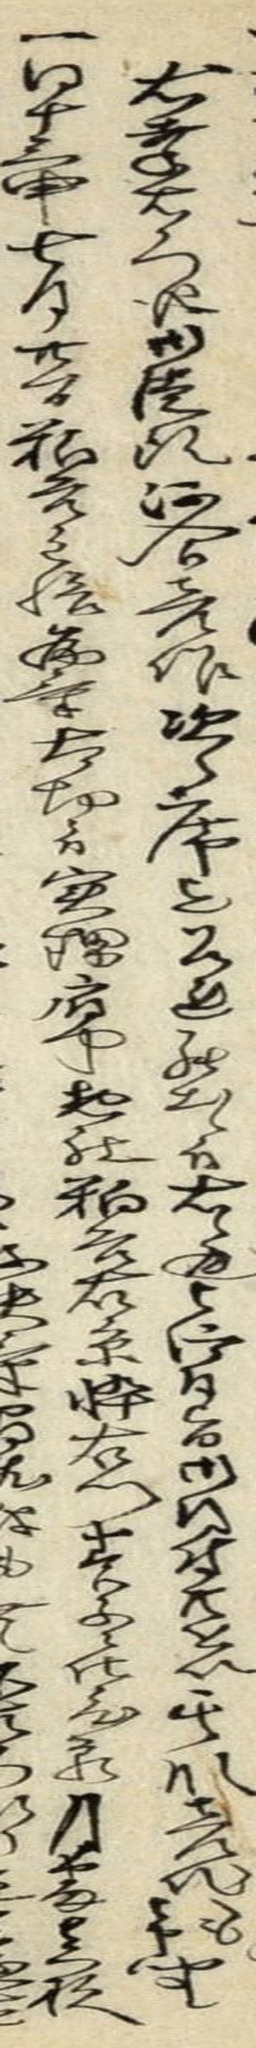一同十三申七月廿一日粕谷主膳為病気大切ニ付実甥府中惣社粕谷右京悴右門養子ニ仕度願月番真杉
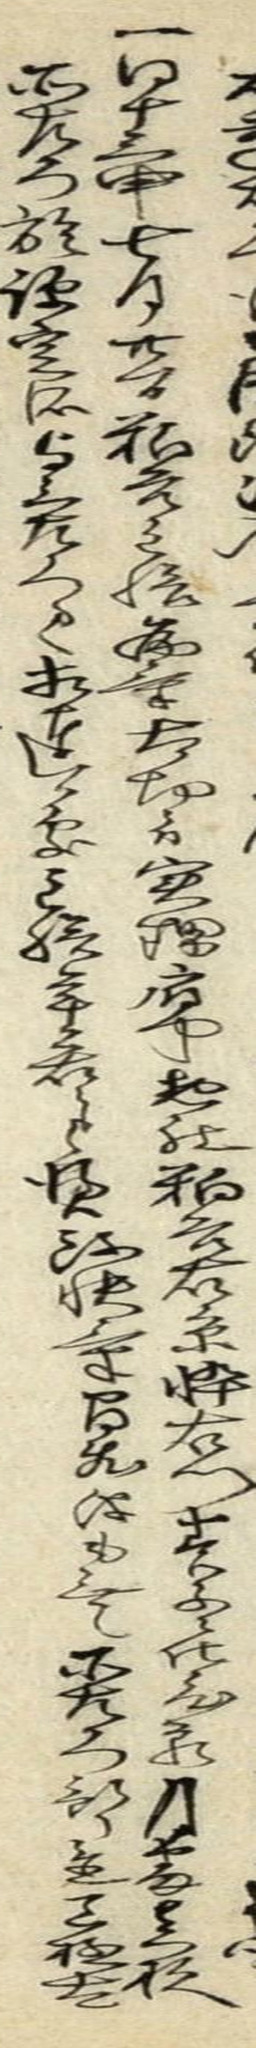所左衛門於評定所与三左衛門方へ相達候処主膳年若ニ而候得ハ致快気間敷儀も無之所左衛門預り置至極太
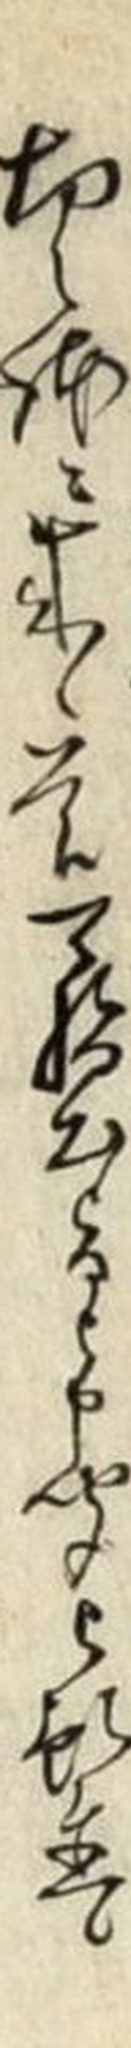切之体ニ成候節可指出旨被申聞被願置候
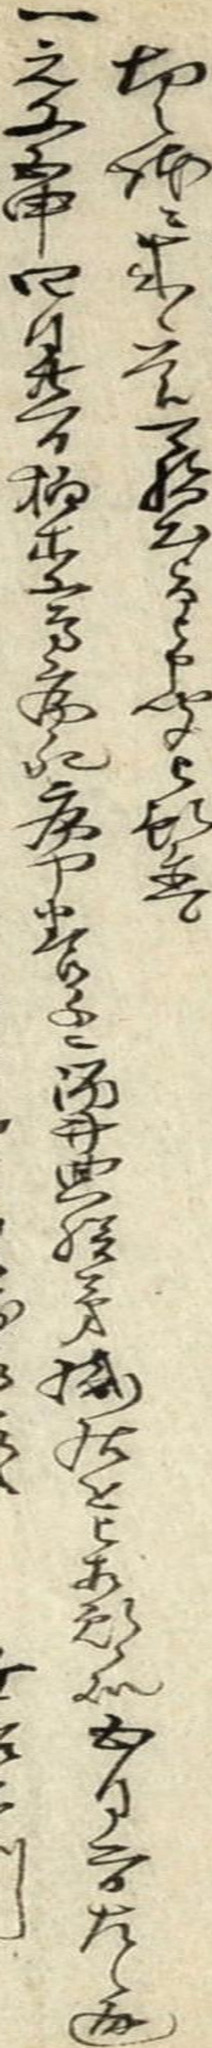一元文五申四月廿一日狛杢方病死病中養子ニ酒井典膳弟織居を被相願候処五月二日左之通
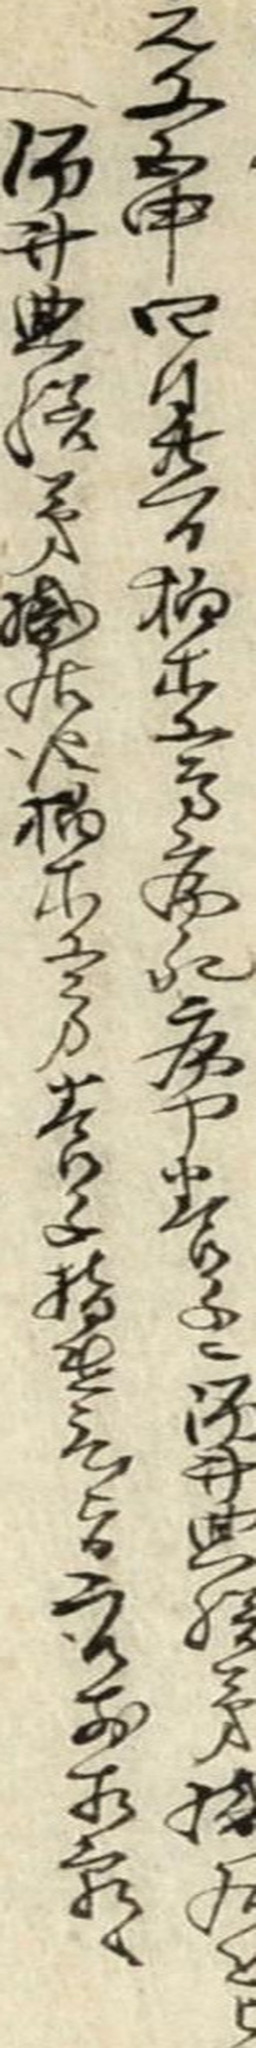酒井典膳弟織居儀狛杢方養子指置度旨最前相願候
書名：養子縁組之部
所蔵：福井県文書館 Fukui Prefectural Archives
